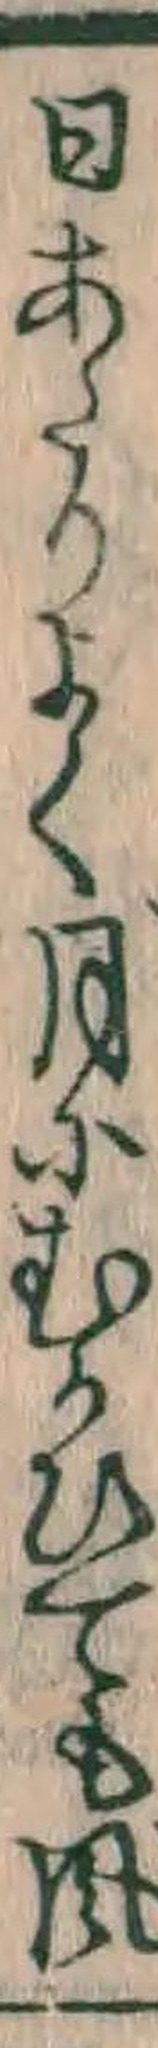日あたりよく月にむかひて風
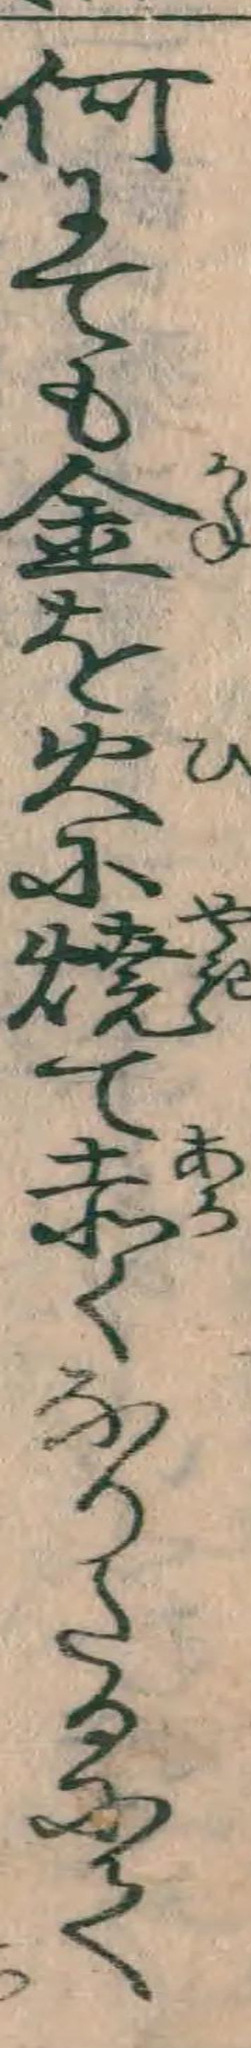何にても金を火に焼て赤くなりたるにて
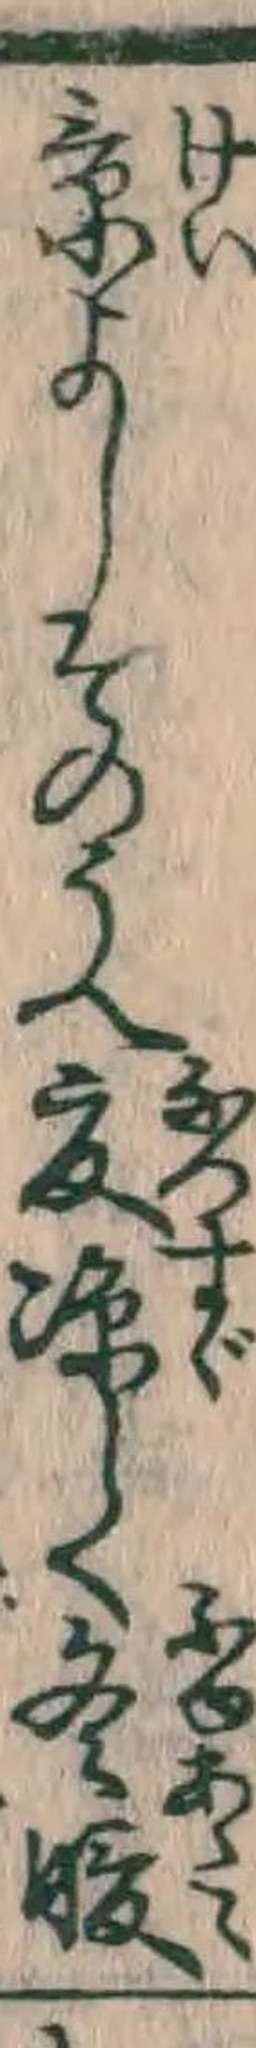景よしそのうへ夏涼しく冬暖
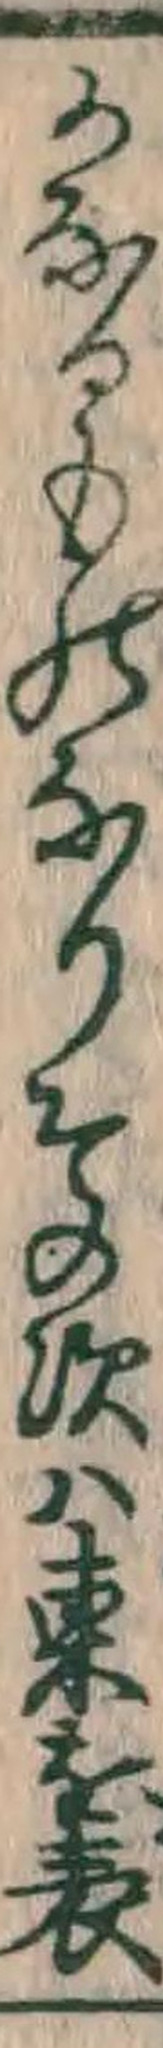かなるものなりその次は東を表
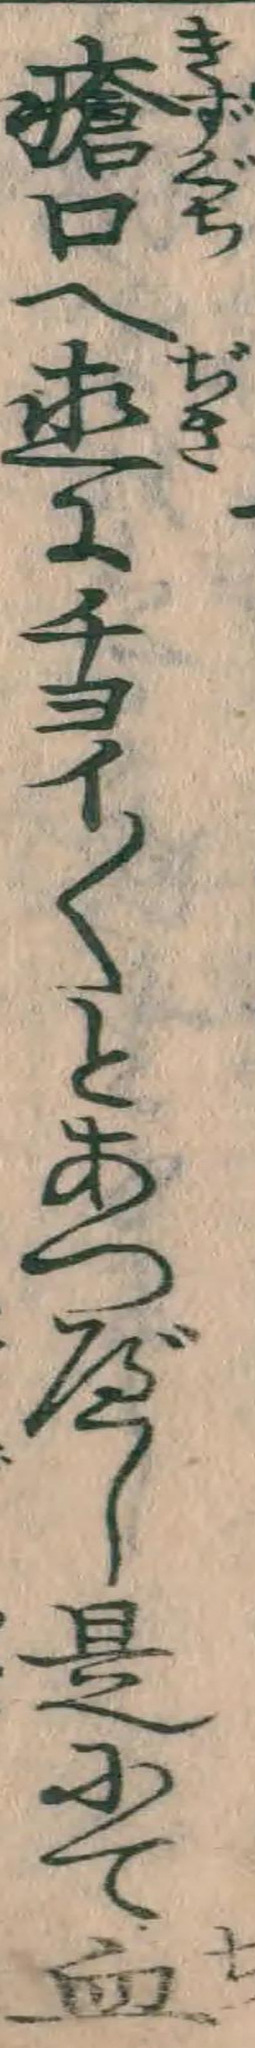瘡口へ直にチヨイ〳〵とあつべし是にて血
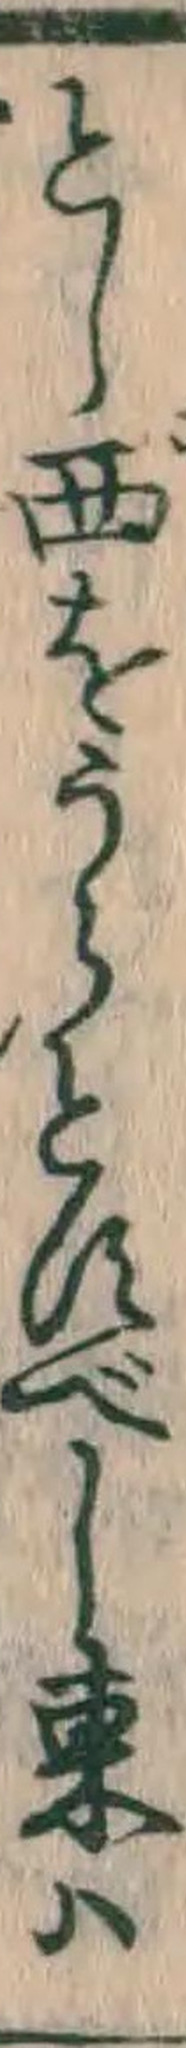とし西をうらとすべし東は
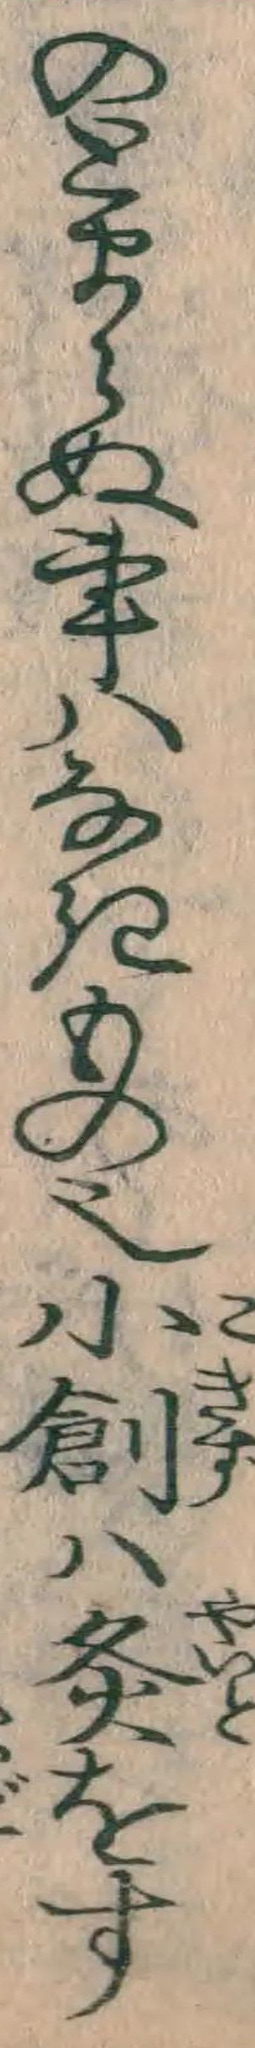のとまらぬ事はなきもの也小創は灸をす
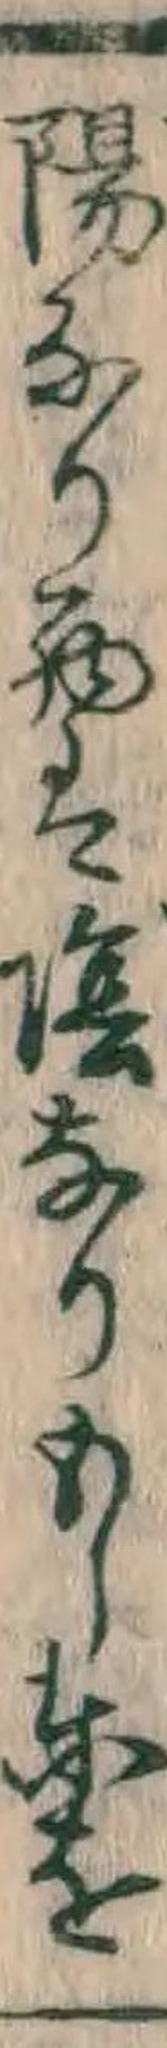陽なり西は陰なりもし東を
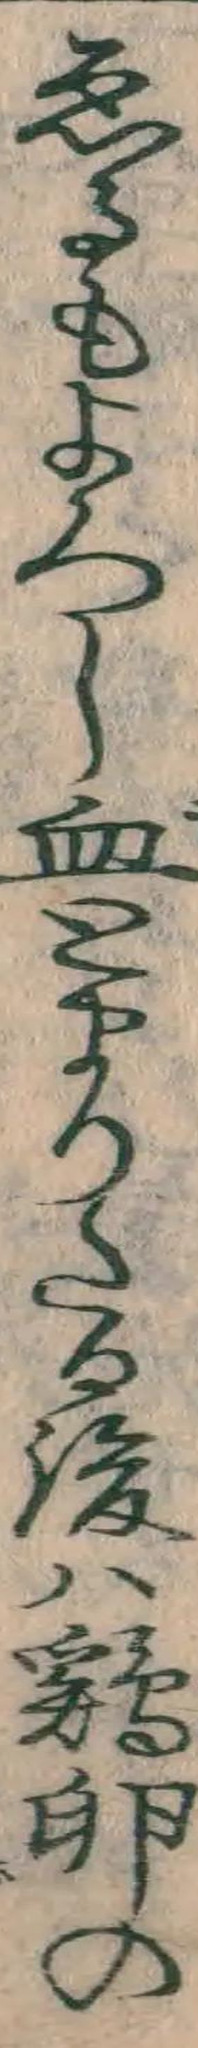ゑるもよろし血とまりたる後は鶏卵の
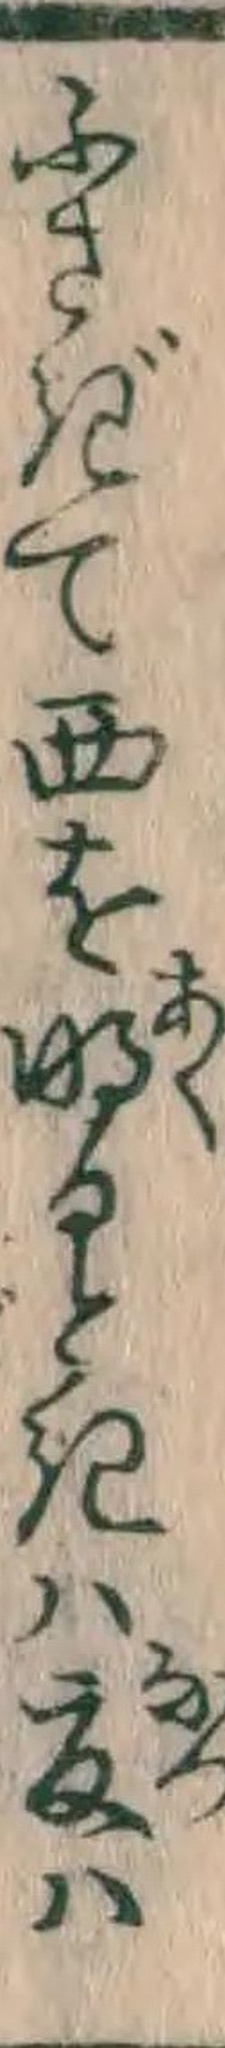ふさぎて西を明るときは夏は
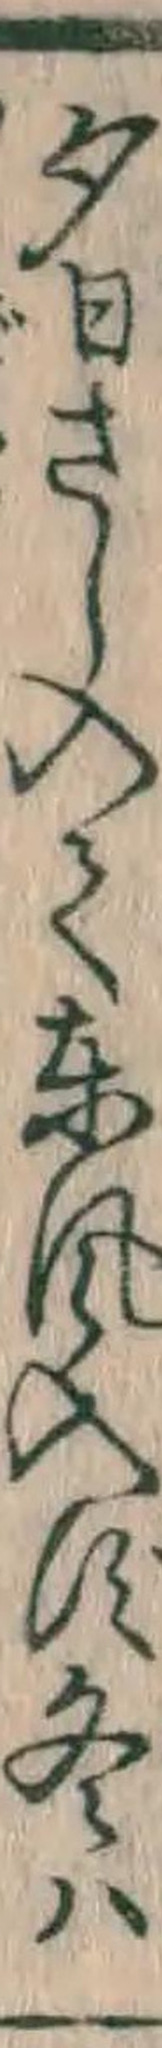夕日さし入て東風入ず冬は
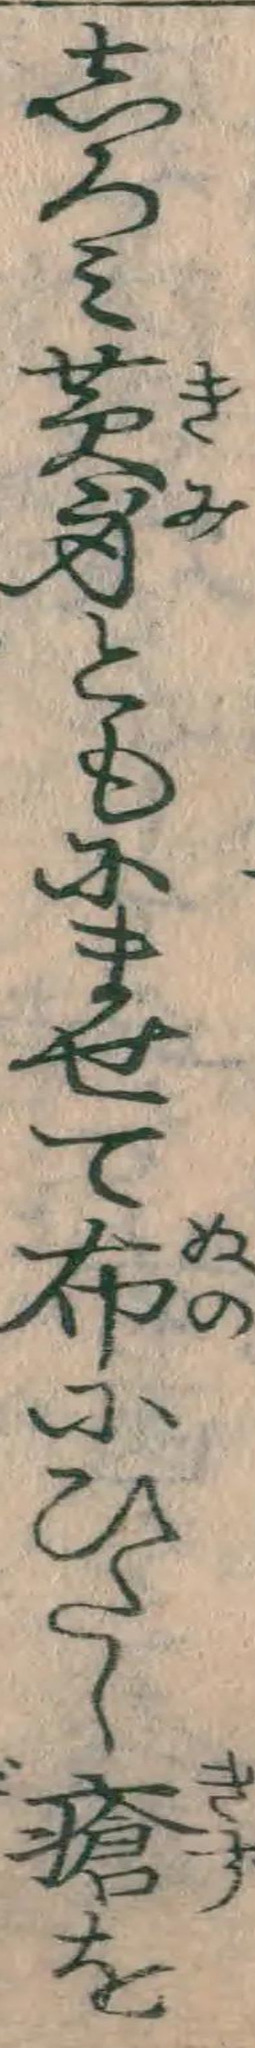しろみ黄身ともにませて布にひたし瘡を
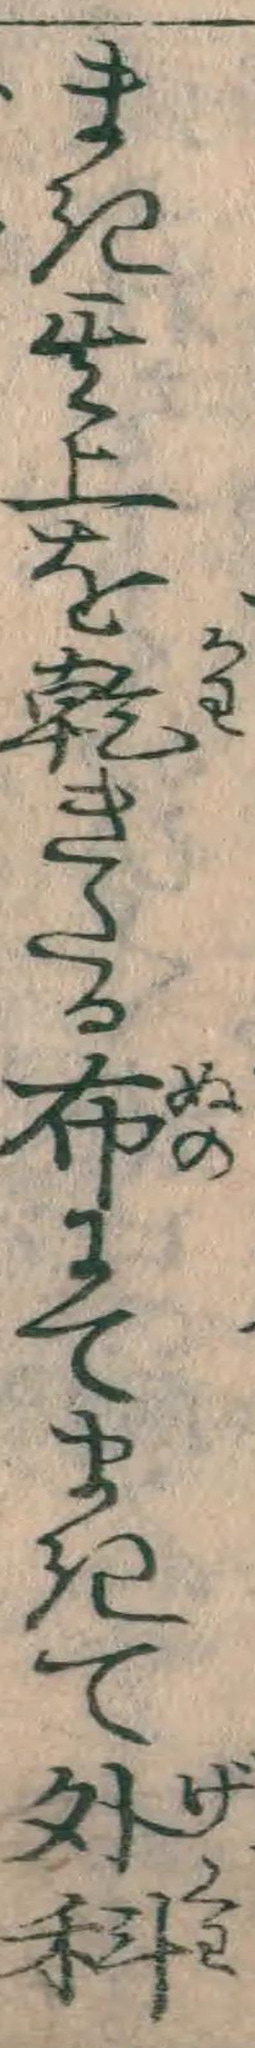まき其上を乾きたる布にてまきて外科
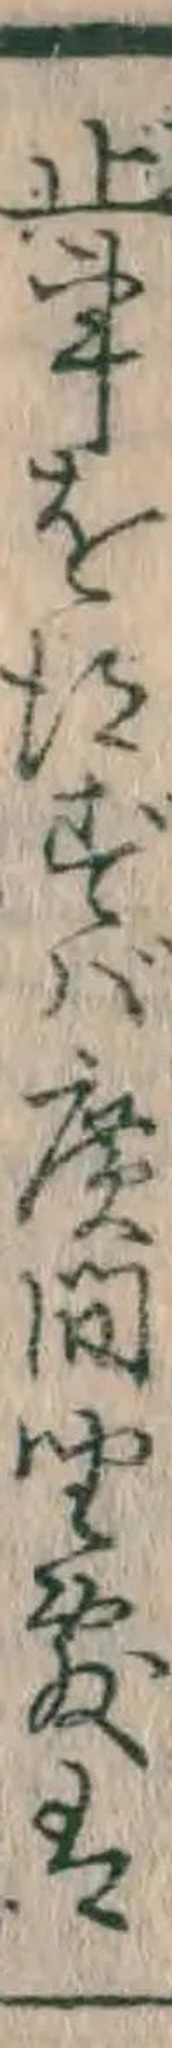止事を得ずば広間座敷は
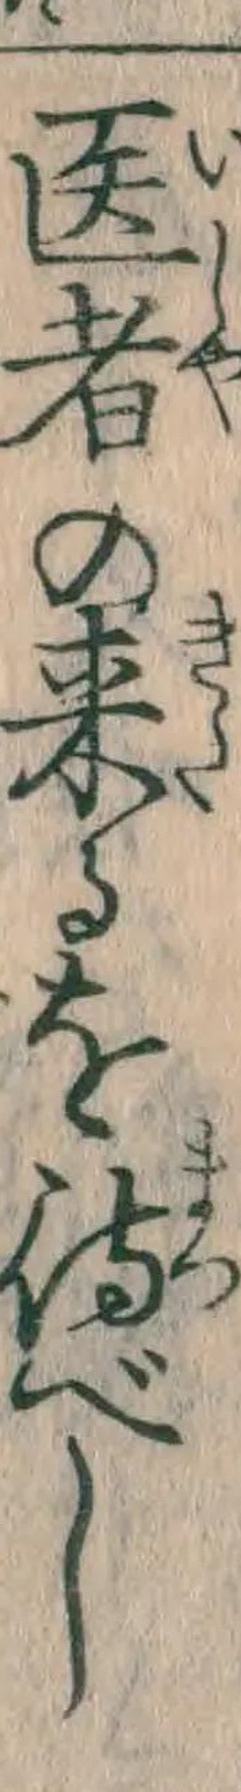医者の来るを待べし
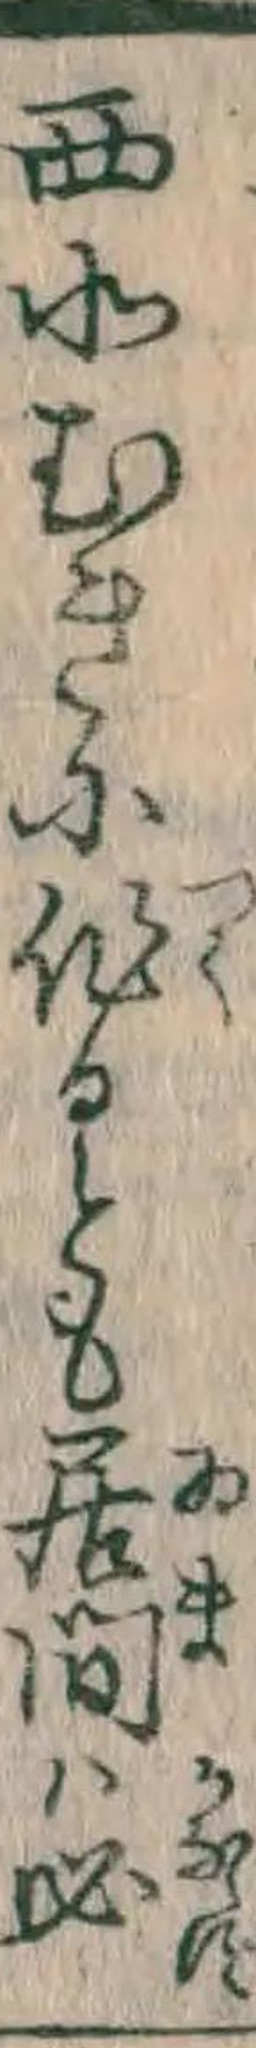西北むきに作るとも居間は必
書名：広益秘事大全 3巻. [3]
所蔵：国立国会図書館 National Diet Library, JAPAN
